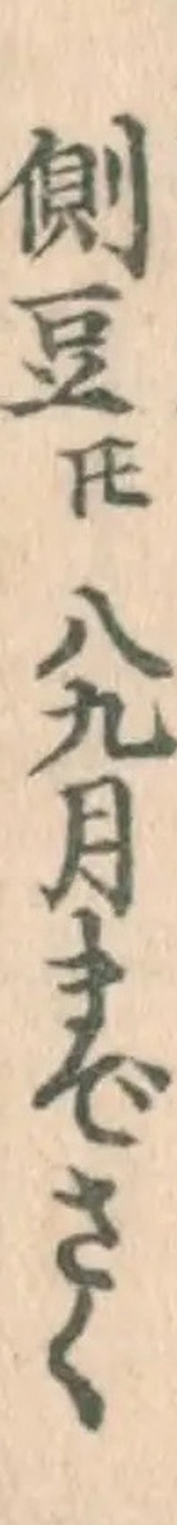側豆共八九月までさく
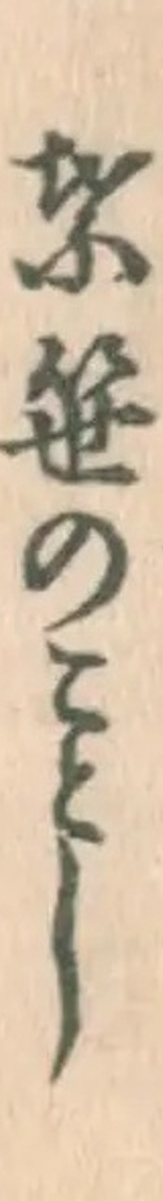葉笹のことし
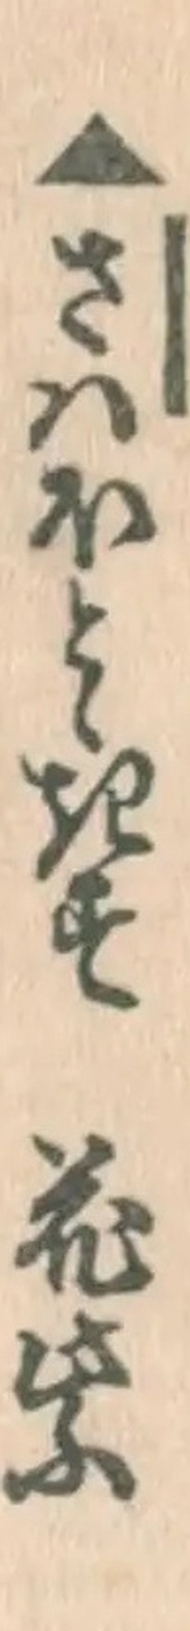▲さハほとゝきす花紫
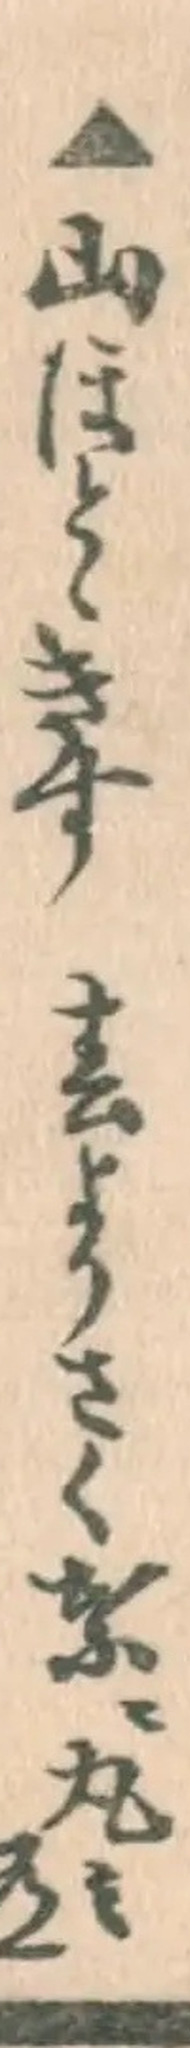▲山ほとゝきす春よりさく葉に丸ミ
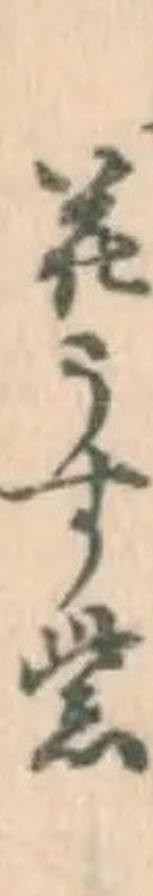花うす紫
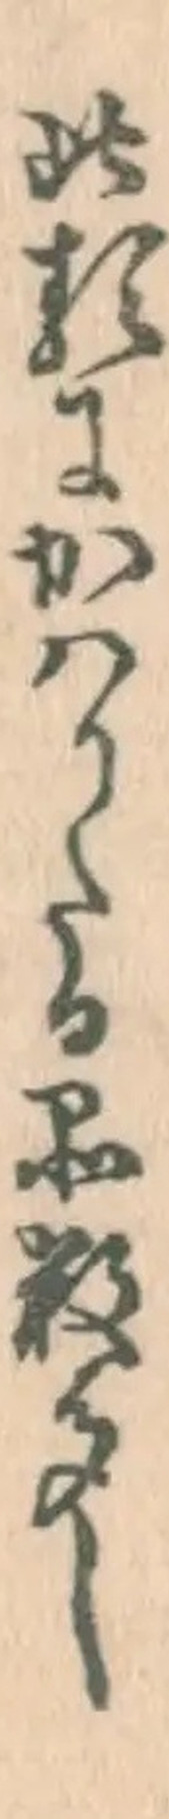此類にかハりたる品数多し
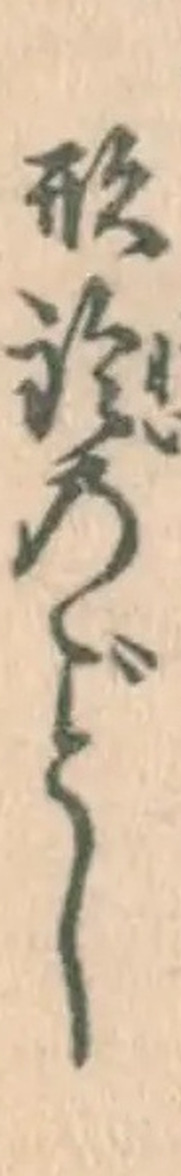形鈴のごとし
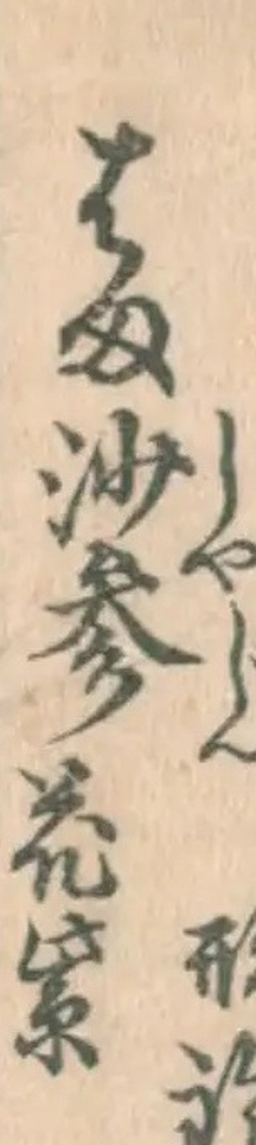はま沙参花紫
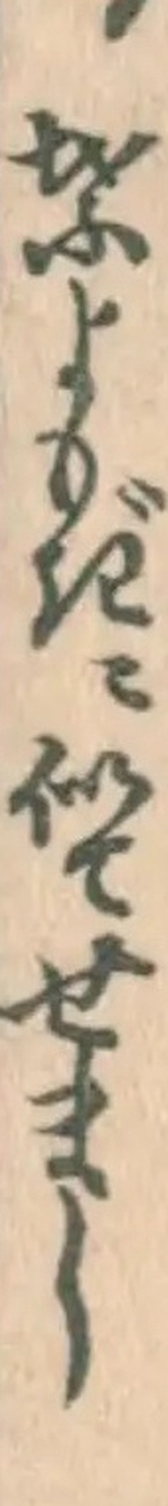葉よもぎに似てせま小
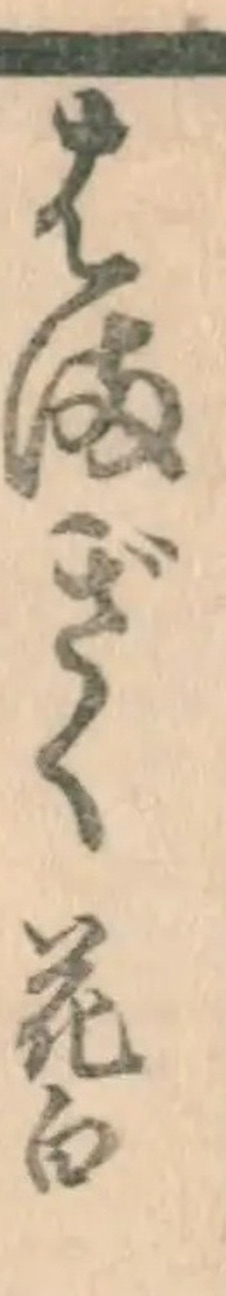はまぎく花白
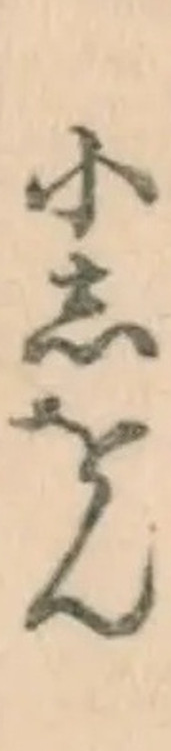小しをん
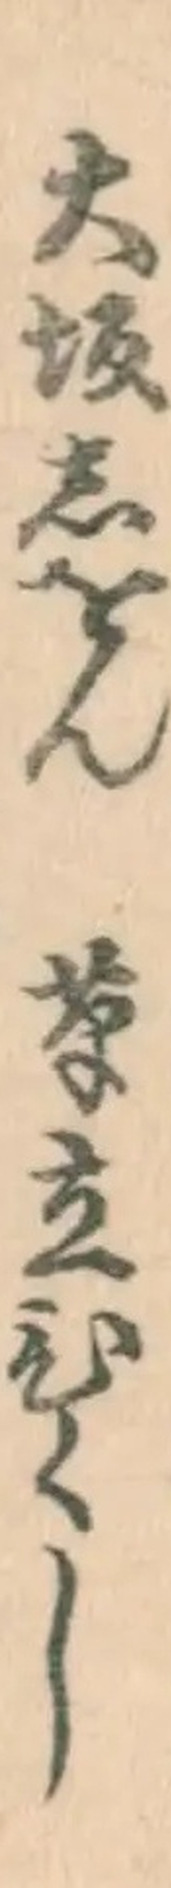大坂しをん草立ひくし
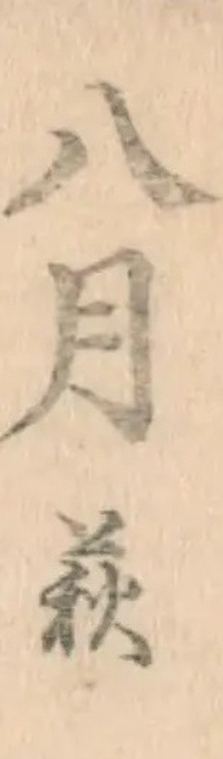八月萩
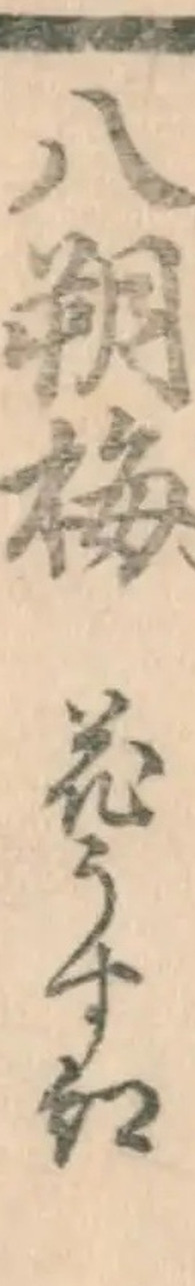八朔梅花うす紅
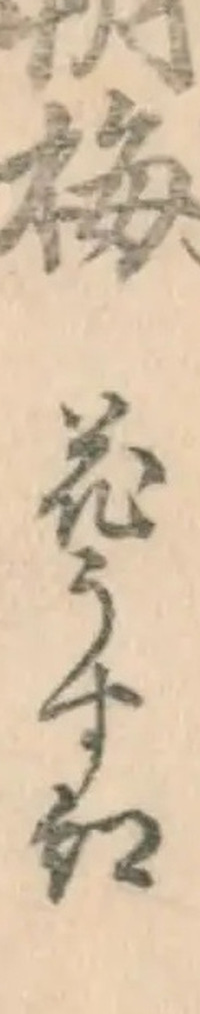八朔梅花うす紅
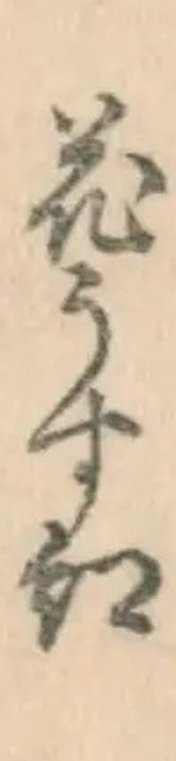花うす紅
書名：茶席挿花集
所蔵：国立国会図書館 National Diet Library, JAPAN
